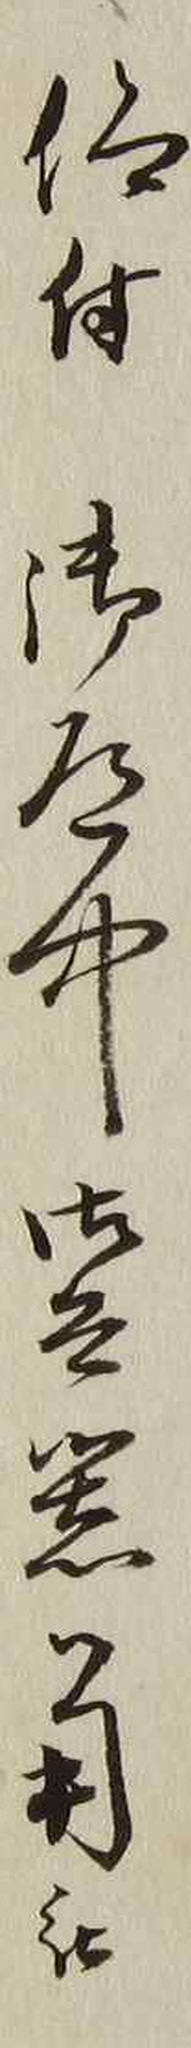仰付御道中御兵器御用被
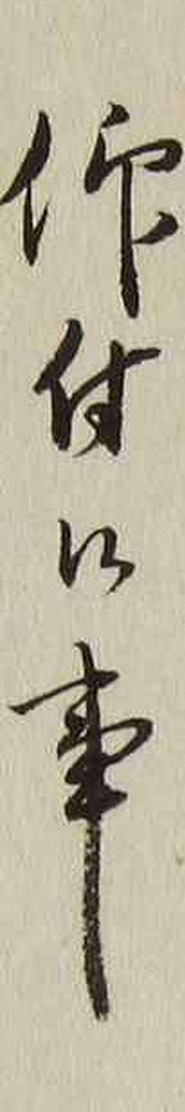仰付候事
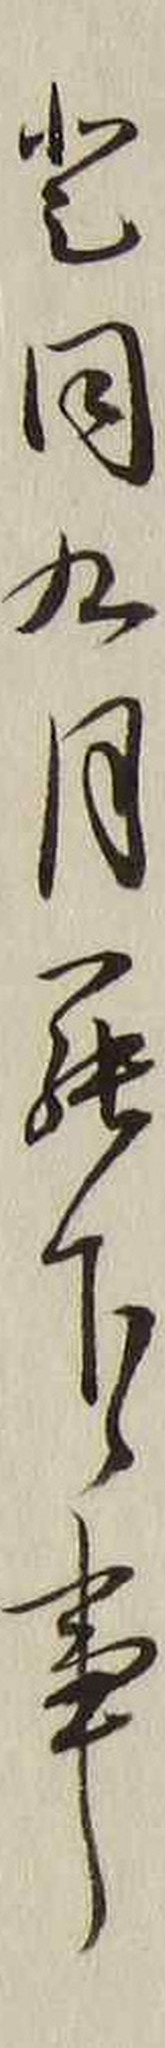登同九月罷下候事

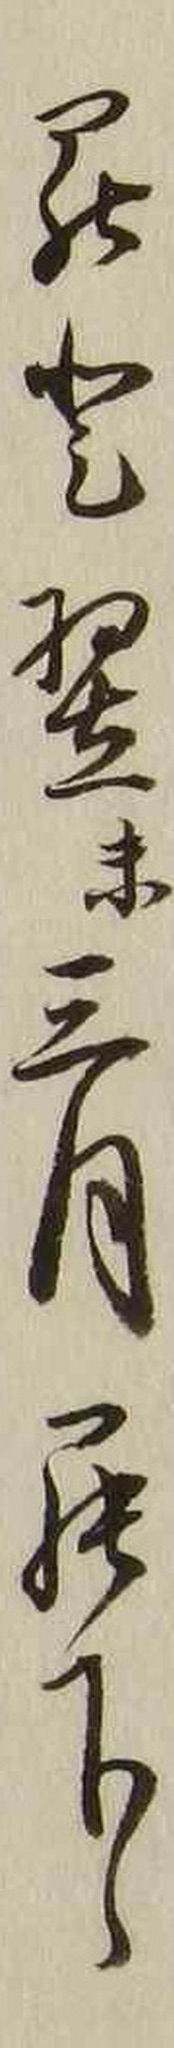罷登翌未三月罷下候
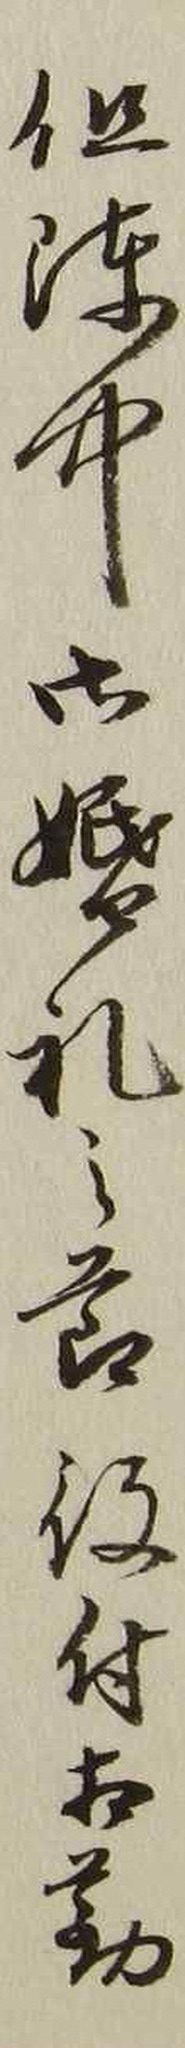但陣中御婚礼之節役付相勤
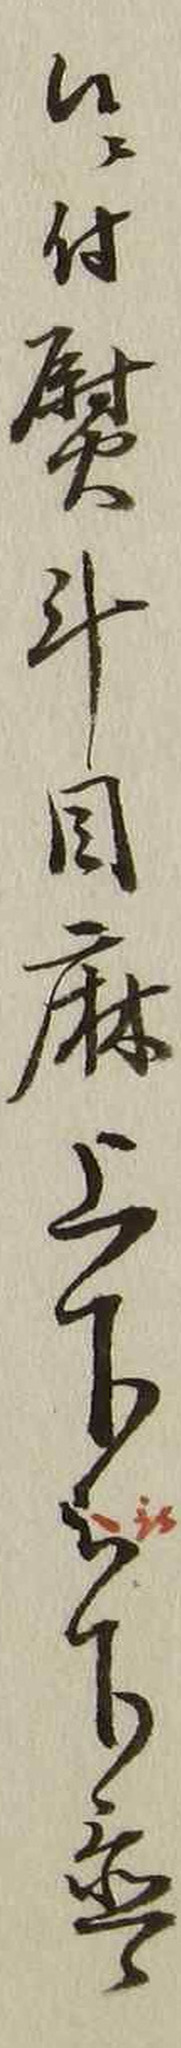候付熨斗目麻上下被下置候
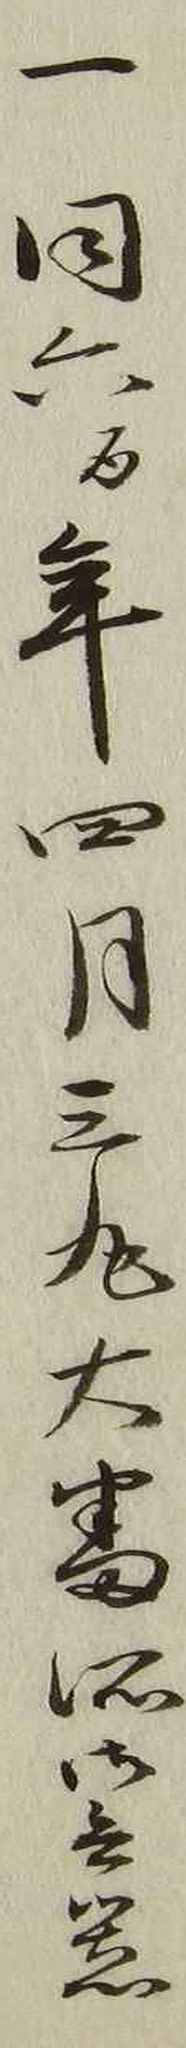一同六酉年四月三丸大番所御兵器
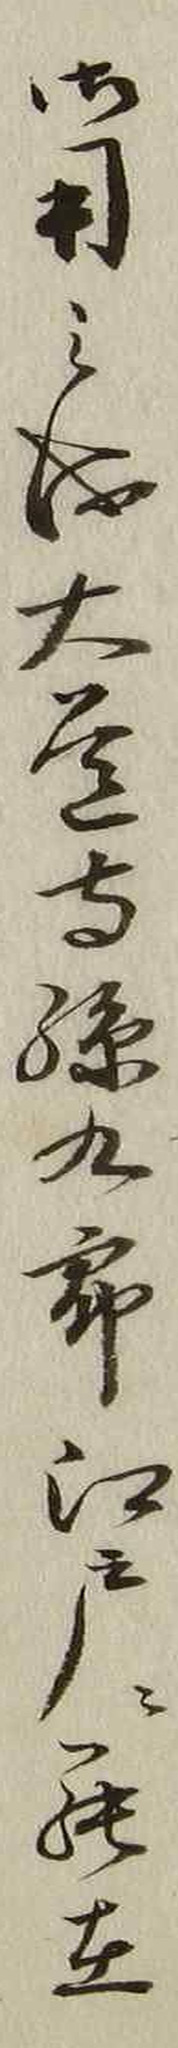御用之儀大道寺孫九郎江戸罷在
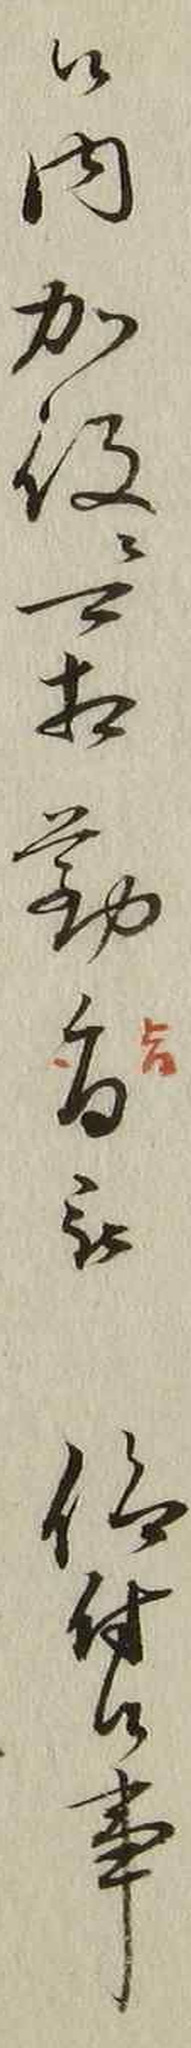候内加役可相勤旨被仰付候事
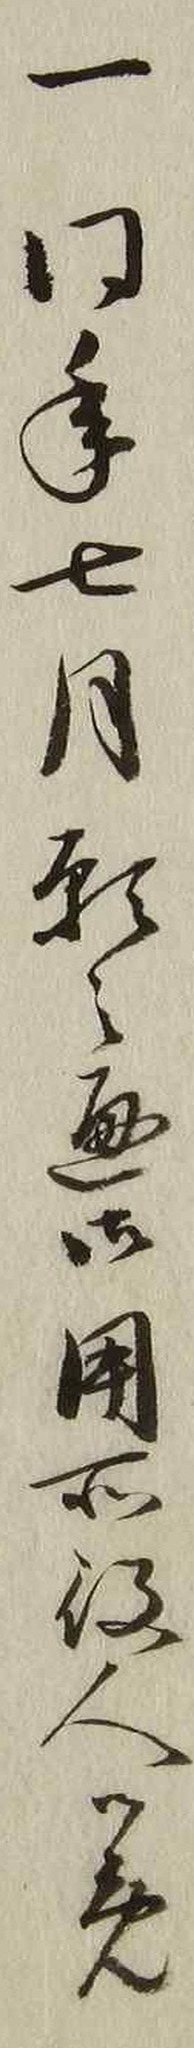一同年七月願之通御用所役人御免
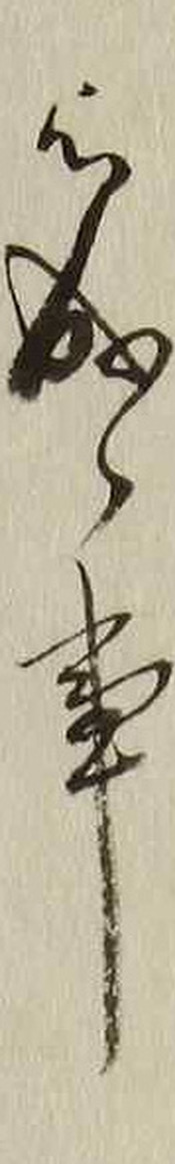被成候事
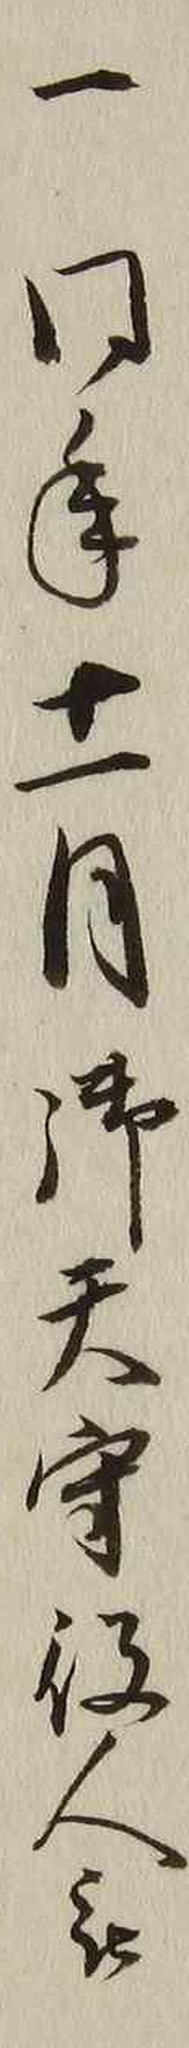一同年十一月御天守役人被
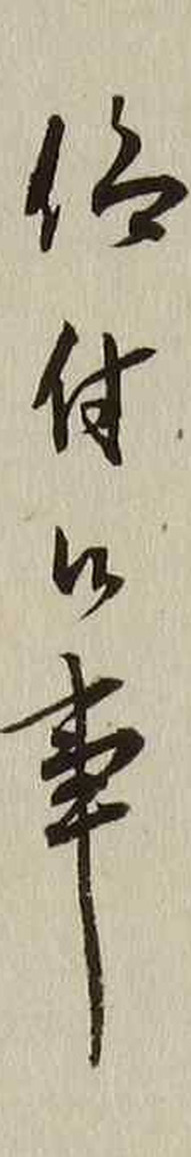仰付候事
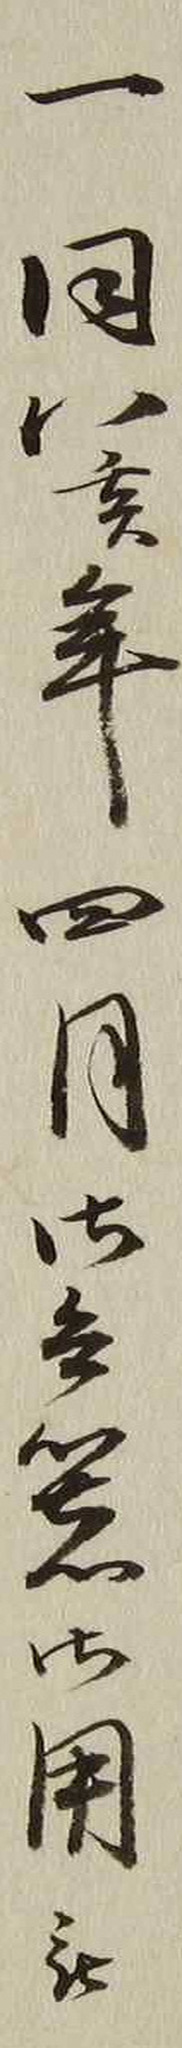一同八亥年四月御兵器御用被
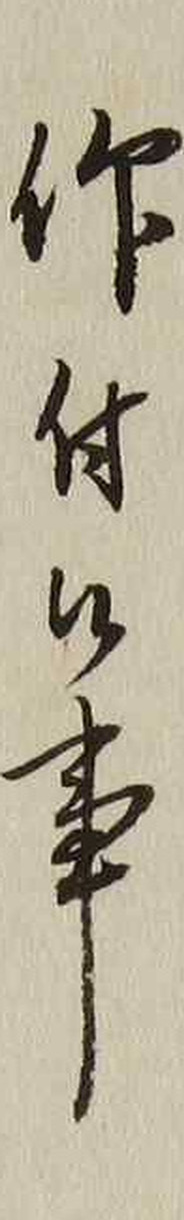仰付候事
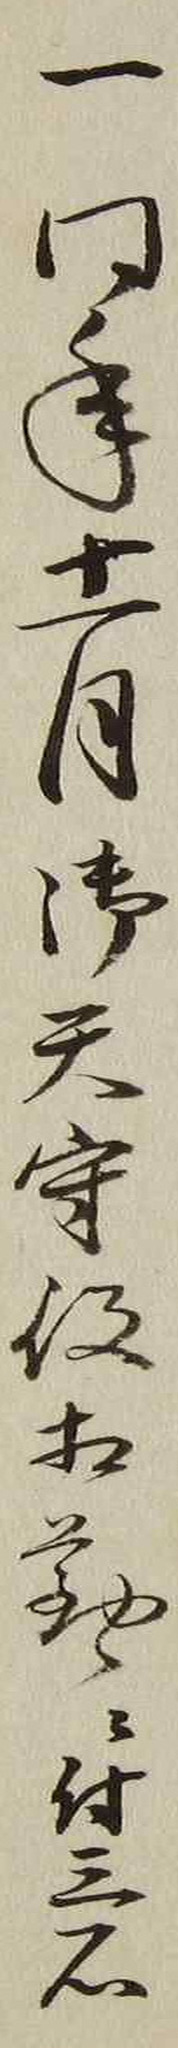一同年十一月御天守役相勤候付三石
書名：諸士系譜　巻之102　か之部10
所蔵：会津若松市立会津図書館
